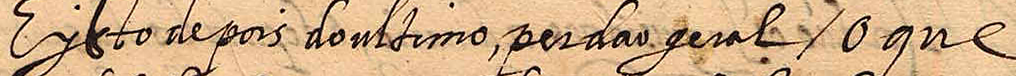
E ysto depois do ultimo, perdão geraL / O que
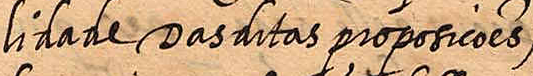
lidade Das ditas proposições
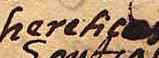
heretic_s
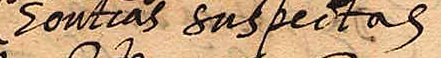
E outras suspectas
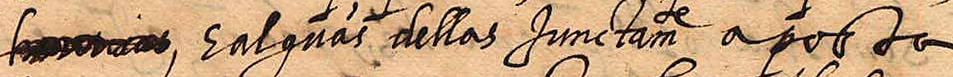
hereticas, E algu̅as dellas Junctamte aposta
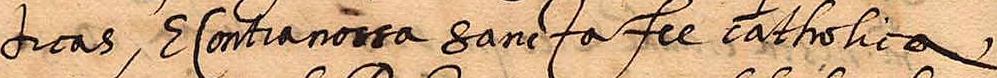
ticas, E Contra nossa sancta fee catholica,
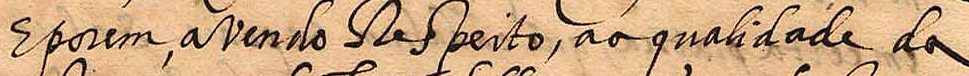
E porem, avendo Respeito, aa qualidade da
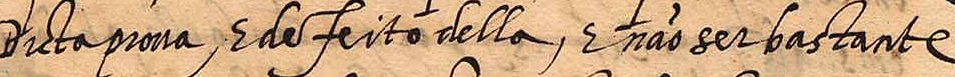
Dicta proua, E defeito della, E não ser bastante
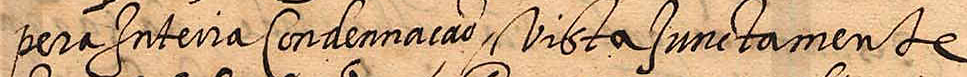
pera Jnteira Condennação, Vista Junctamente
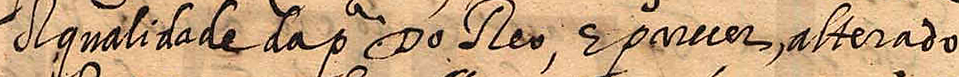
A qualidade da pa. Do Reo, E pareçer, alterado
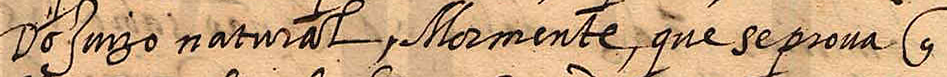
Do Juizo naturaL, Mormente, que se proua q̅
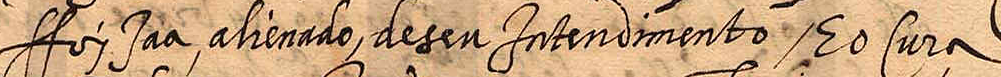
ffoy Jaa, alienado, de seu Jntendimento / E o Cura
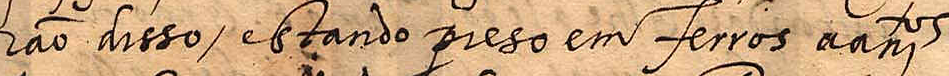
rão disso / estando preso em ferros aa mtos
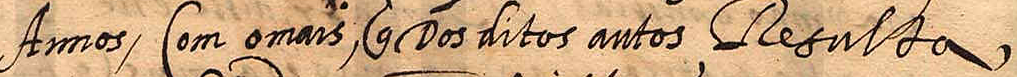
Annos, Com o mais, q̅ Dos ditos autos Resulta,
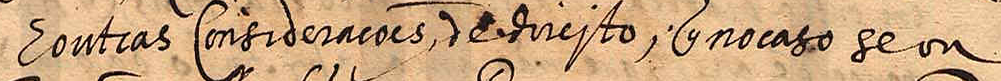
E outras Consideraçoẽs, de direjto, q̅ no caso se ou
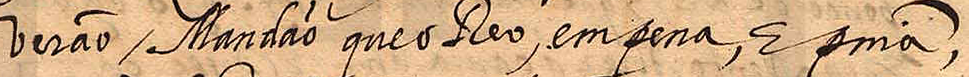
verão / Mandão que o Reo, em pena, E pniā,
